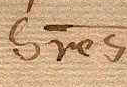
Sr̄es
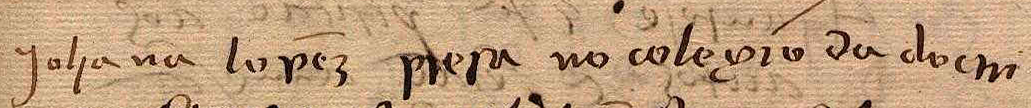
Johana lopez presa no colegio da doctri
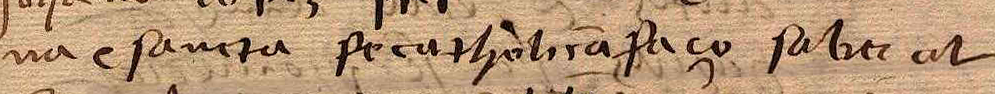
na e sancta fe catholica faço saber a V
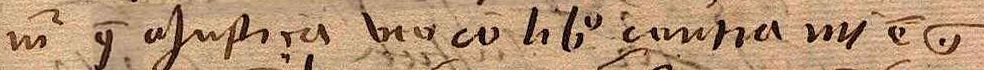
mr q̄ a Justiça veo cō libo contra mj ē q̄
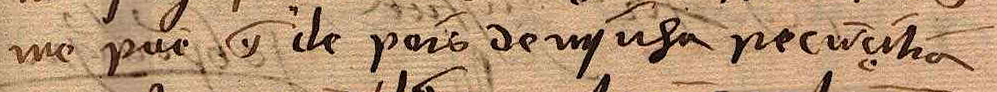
me poẽ q̄ depois de mjnha recūcilia
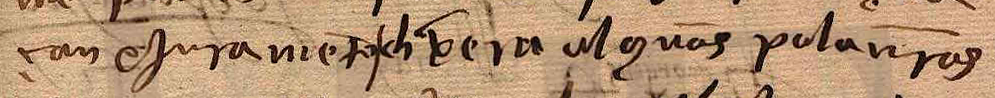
çam e Juramēto dixera algūas palauras
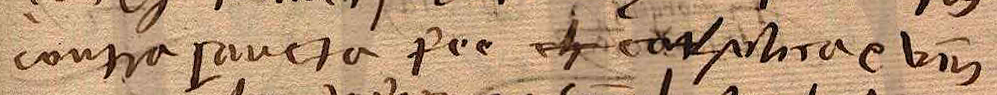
contra sancta fee ch catholica e vim
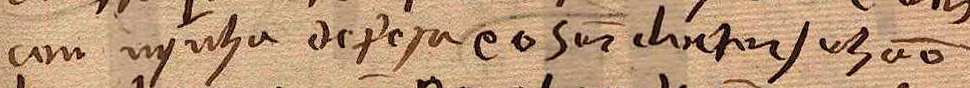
com mjnha defesa e o Sōr doctor Johão
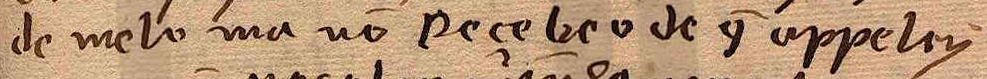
de melo ma nō Recebeo de q̄ appeley
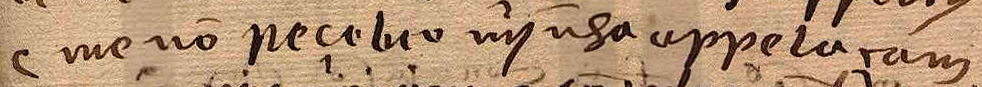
e me nō recebeo mjnha appelaçam
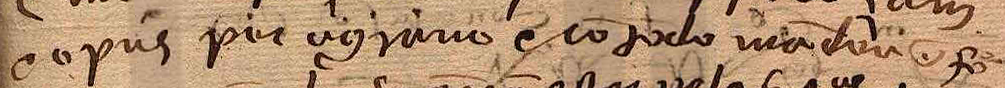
e o pus per agrauo e cō todo mādou q̄ fo
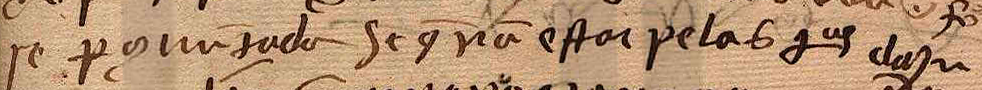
se ꝑguntada se q̄ria estar pelas tas da Ju
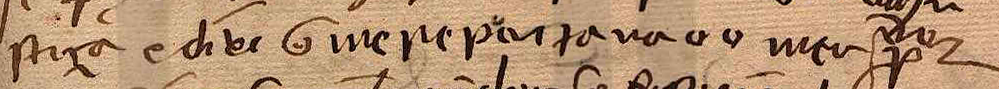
stiça e dixe q̄ me reportaua oo meu ꝓdor
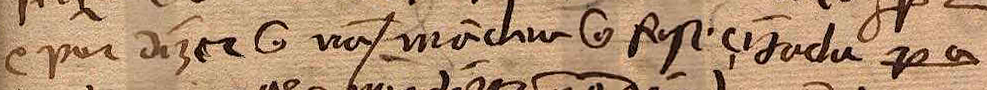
e por dizer q̄ nā / mādou q̄ fose citada ꝑa
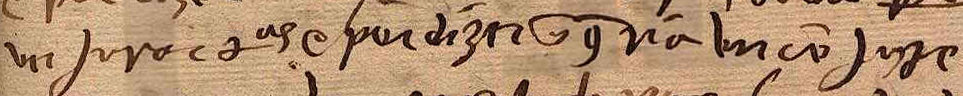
ver Jurar tas e por dizer q̄ q̄ria vir c̄o Jnte
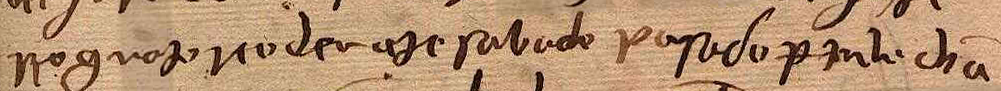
rroguatorio deu ate sabado pasado ꝑ todo dia
